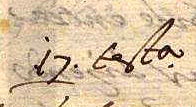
17. testa.
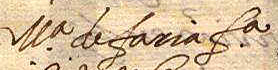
M.a de faria f.a
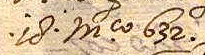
.18. m.co 632.
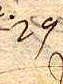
29
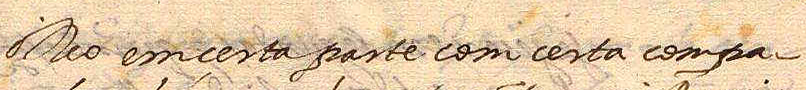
o Reo em certa parte com certa compa
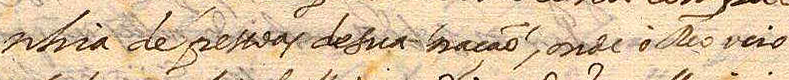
nhia de pessoas de sua naçaõ, onde o Reo veio
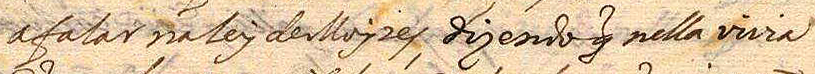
a falar na ley de Moyzes, dizendo q̄ nella vivia
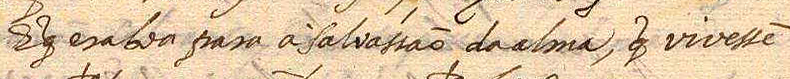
E q̄ era boa para a salvassaõ da alma, q̄ vivessē
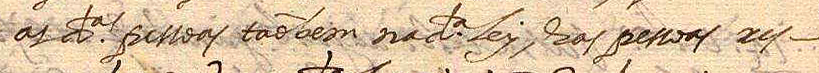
as d̄as. pessoas taõbem na d̄.a ley, E as pessoas res
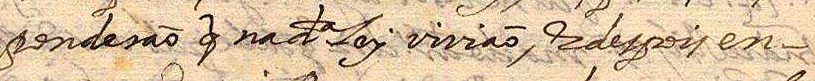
ponderaõ q̄ na d̄a Ley viviaõ, E despois en
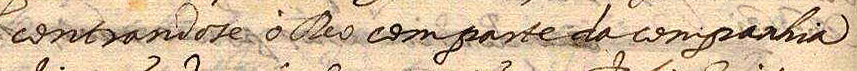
contrandose o Reo com parte da companhia
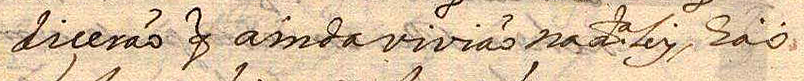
diçeraõ q̄ ainda viviaõ na d̄.a ley, E ao
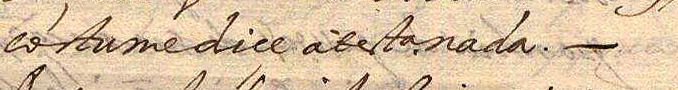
costume dice, a testa. nada. ‒
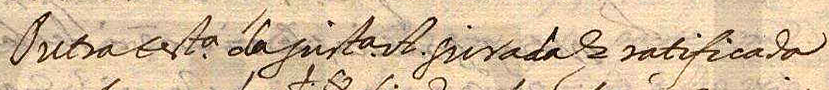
Outra test.a da justa. A. jurada, E ratificada
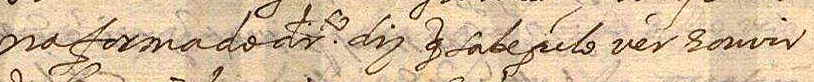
na forma do drto. diz q̄ sabe pelo uer E ouvir
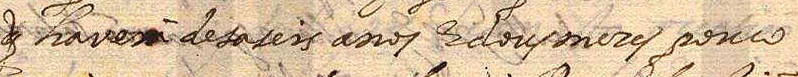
q̄ haverá desaseis anos E dous mezes pouco
